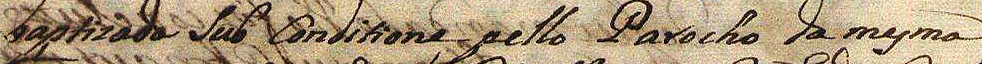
baptizada sub Conditione, pello Parocho da mesma
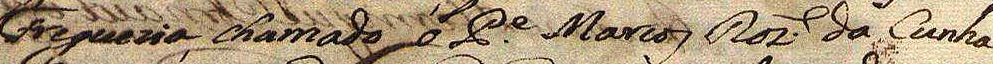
Freguezia, chamado o P.e Marcos Roz̄. da Cunha,
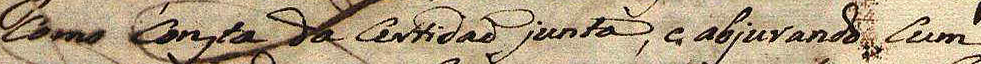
Como consta da Certidaõ junta, e abjurando Cum
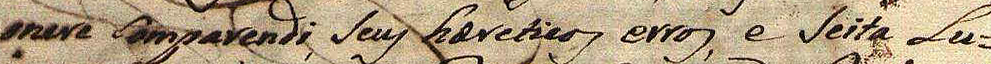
onere Comparendi, seus hereticos erros, e seita Lu
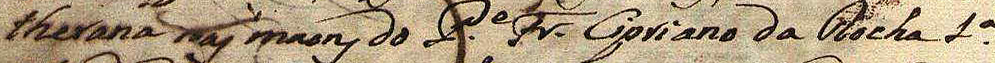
therana na maons do P.e Fr. Cipriano da Rocha 1.a
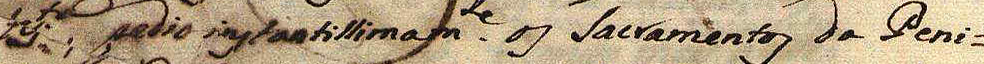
tes.ta; pedio instantissimam.te os sacramentos da Peni
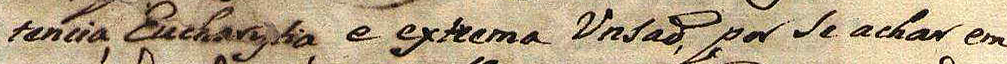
tencia, Eucharistia, e extrema Vnsaõ, por se achar em
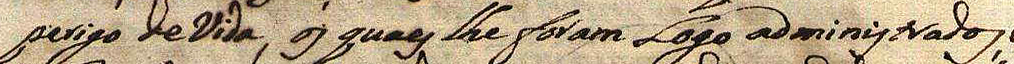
perigo de Vida, os quaes lhe foram Logo administrados, e
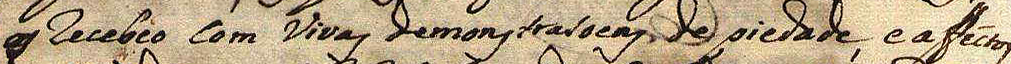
os Recebeo com vivas demonstrasoens de piedade, e affectos
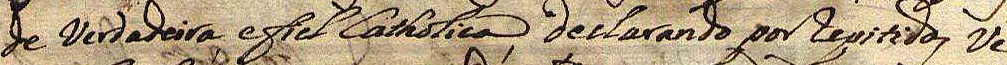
de verdadeira e fiel Catholica, declarando por Repitidas ve
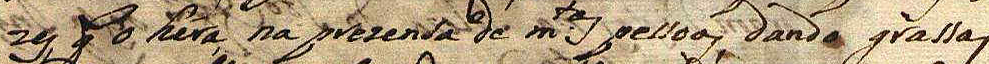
zes, q̄ o hera, na prezensa de m.tas pessoas, dando grassas
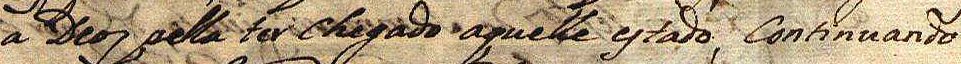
a Deos pella ter chegado aquelle estado, continuando
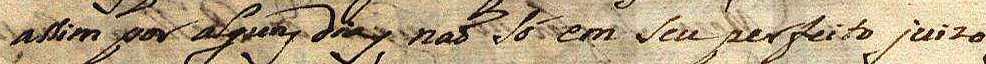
assim por alguns dias, naõ só em seu perfeito juizo,
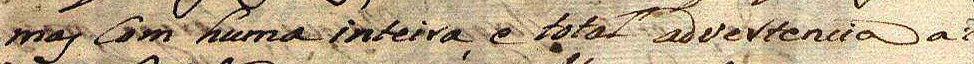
mas Com huma inteira, e total advertencia a
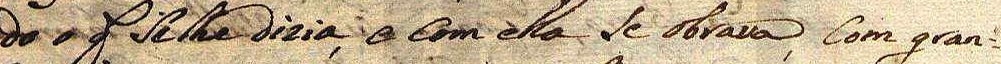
do o q̄ selhe dizia, e com ella se obrava, Com gran
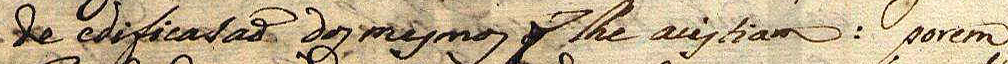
de edificasaõ dos mesmos q̄ lhe acistiam: porem
